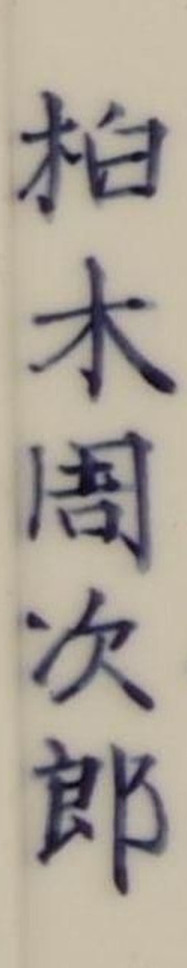柏木周次郎

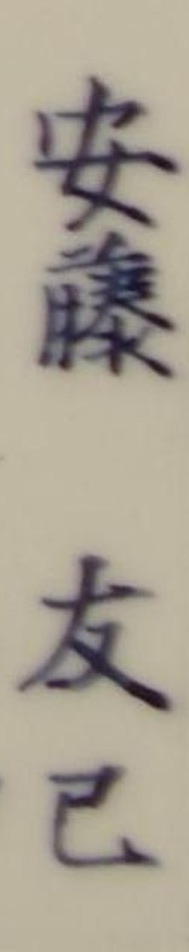安藤友己
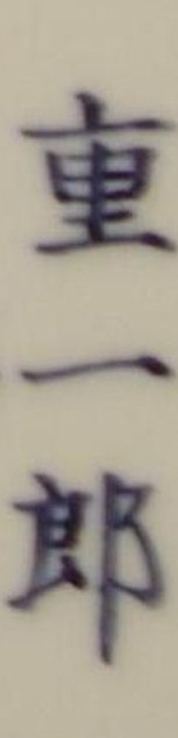重一郎
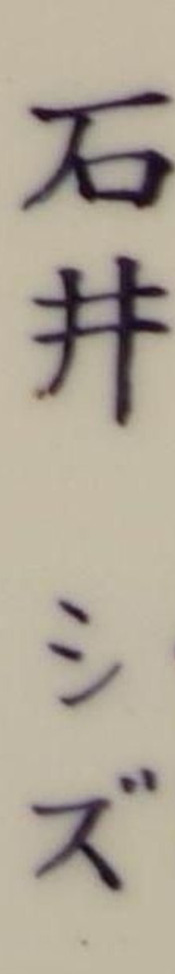石井シズ
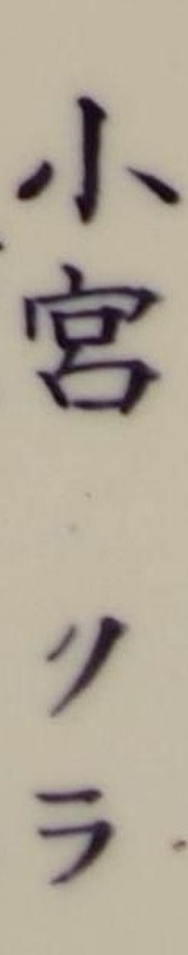小宮クラ
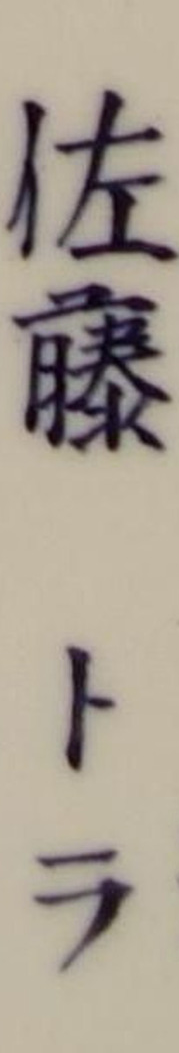佐藤トラ
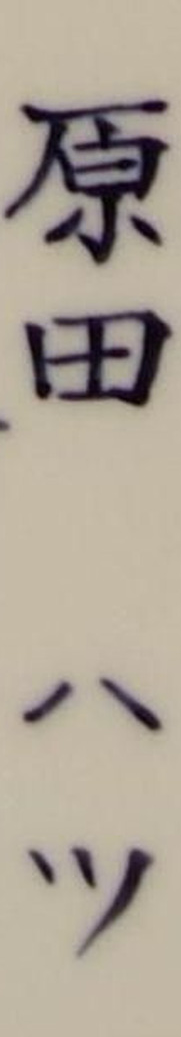原田ハツ
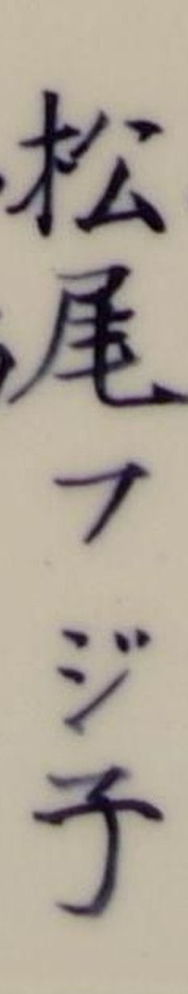松尾フジ子
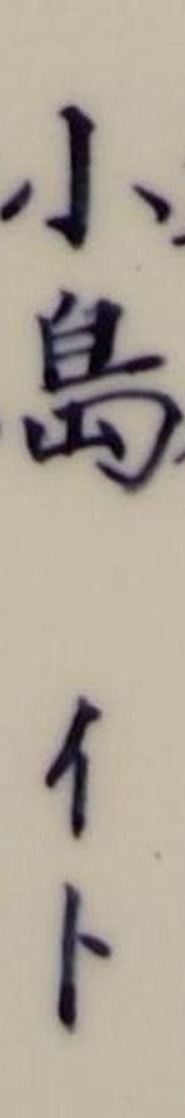小島イト
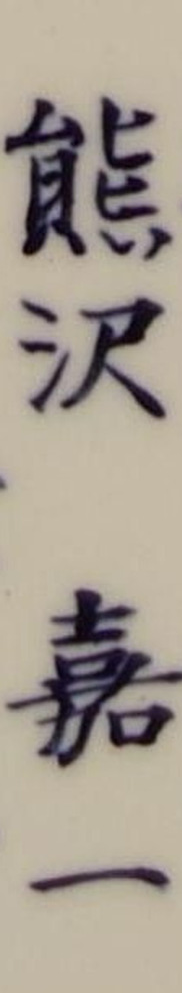熊沢嘉一
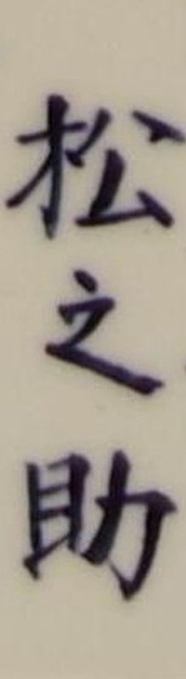松之助
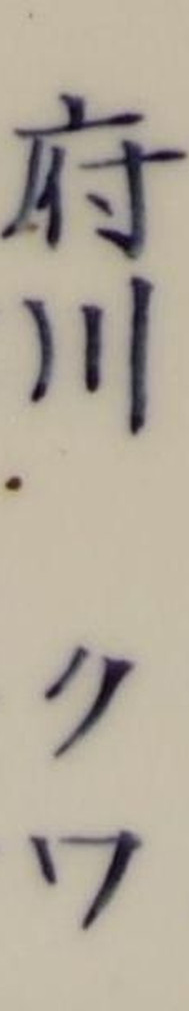府川クワ
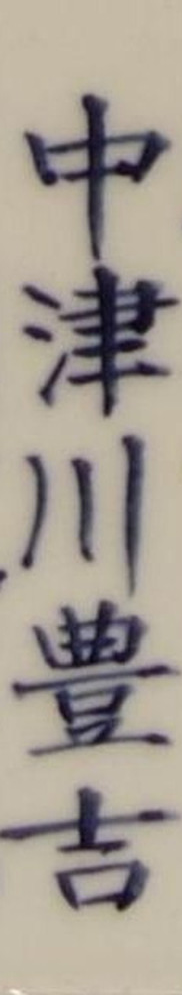中津川豊吉
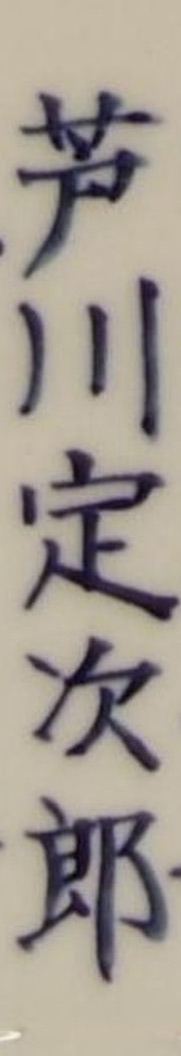芦川定次郎
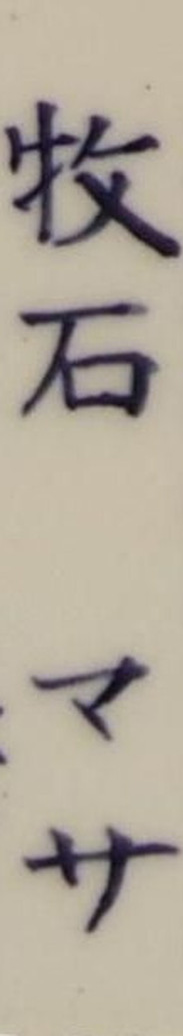牧石マサ
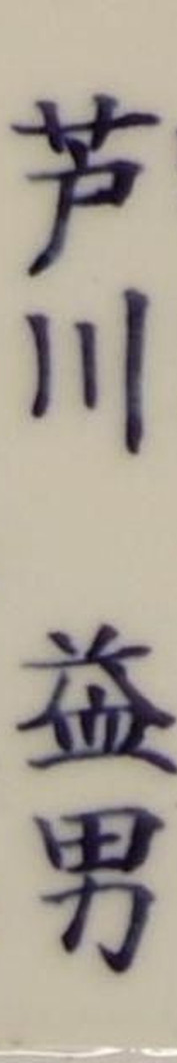芦川益男
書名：M~S
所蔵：高野山金剛峯寺
